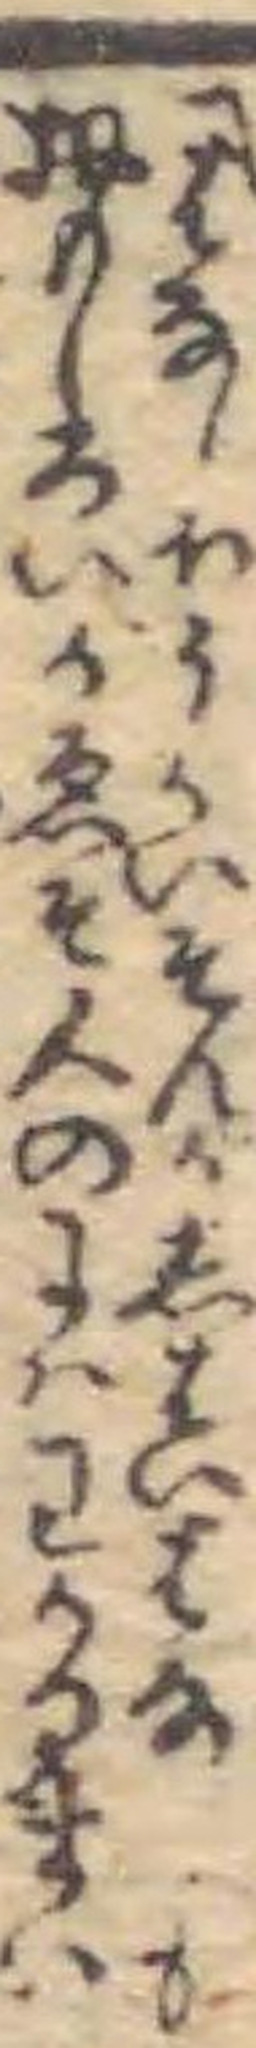おもしろいがゑそ人のに？はわかるまい
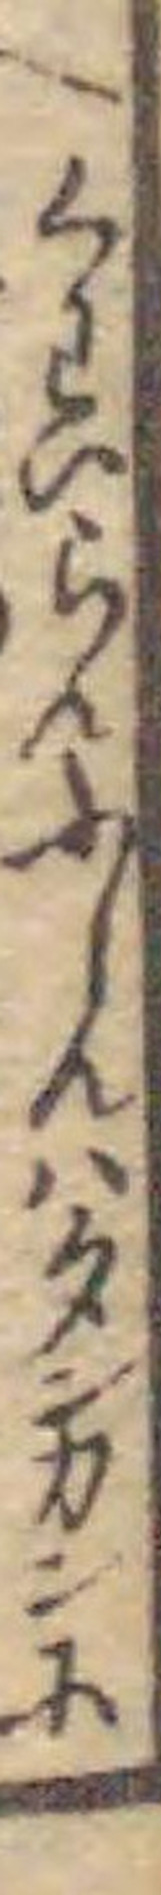くわいらんふしんはタンカンに
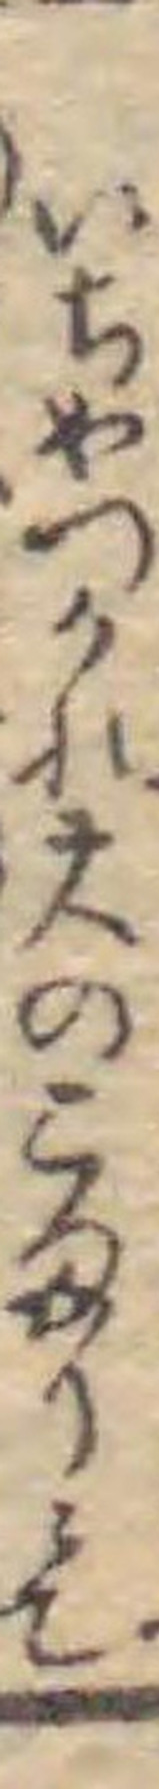いちめつかれ大のこまりにて
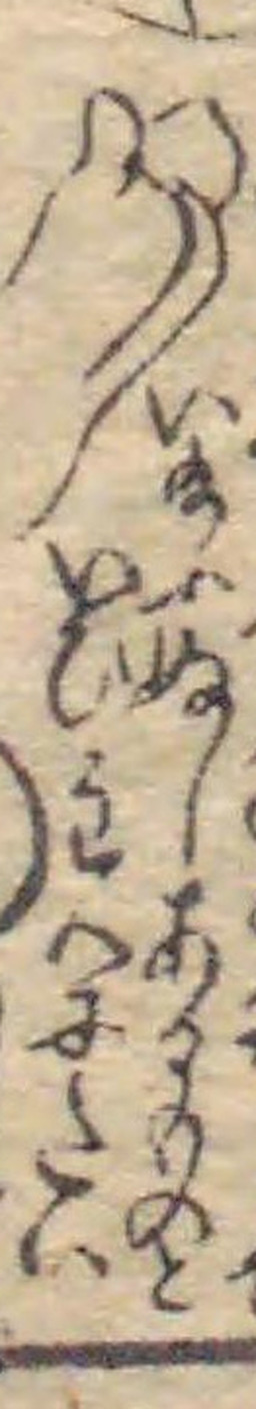いひ主人にたい
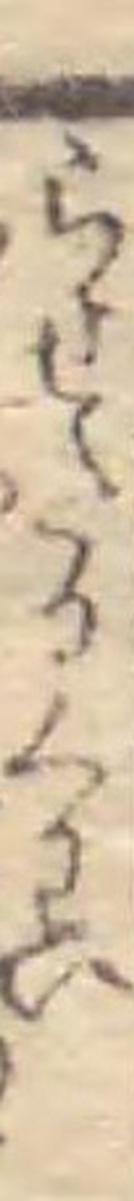らせたるくわい
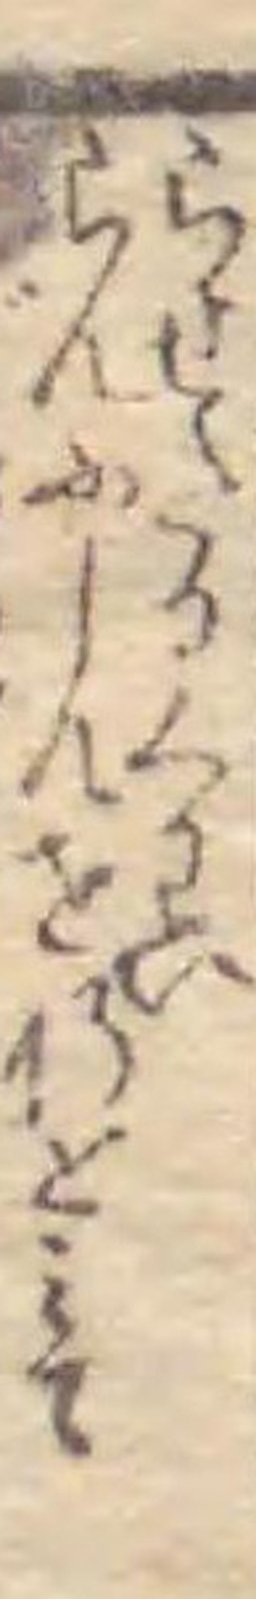らんふしんを後？をみて
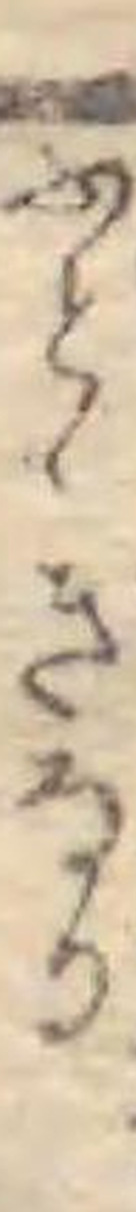ふとゝきなり
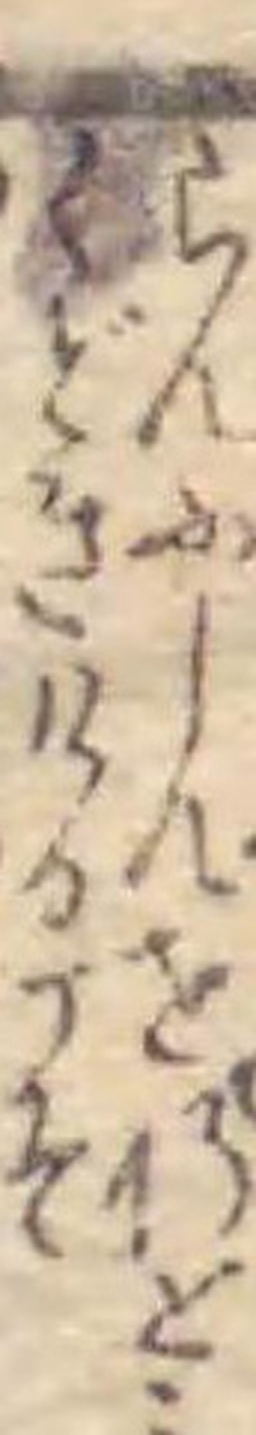くどきけるこそ
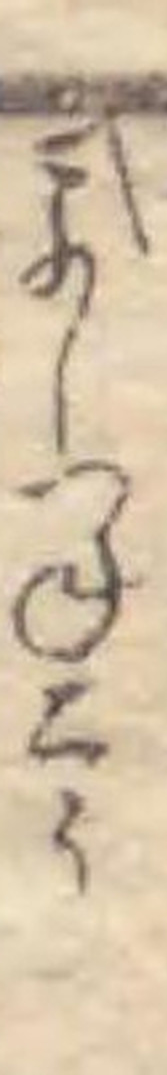〽よしつねこう
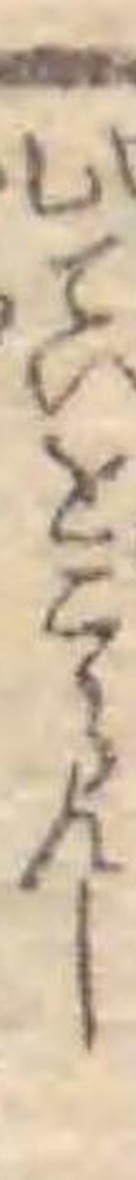此ていをこらんし
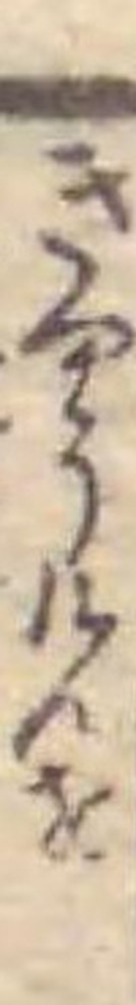きやうけんを
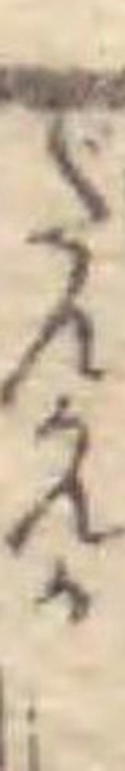だんかんか
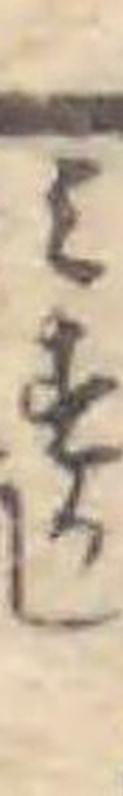みすかし
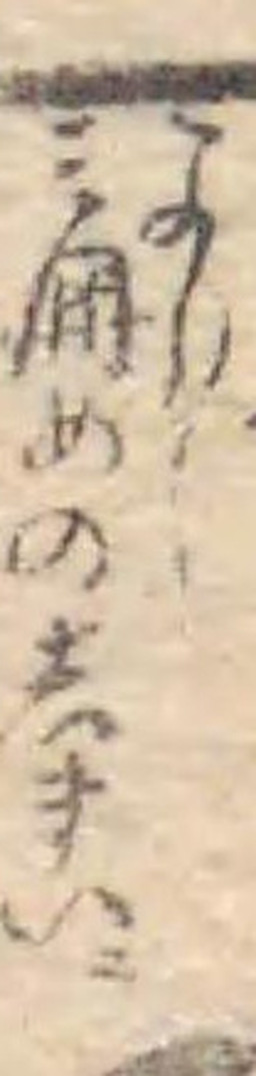三冊めのしまいに
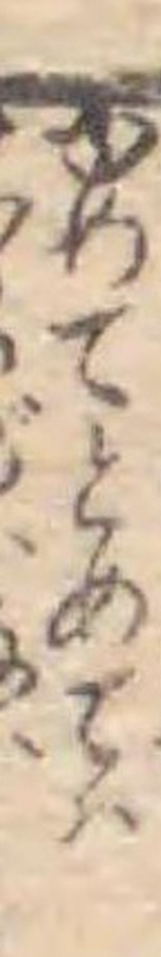ゆめてとめては
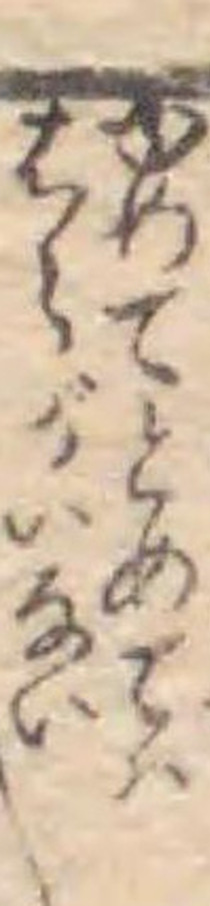はらがいない
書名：悦贔負蝦夷押領 : 3巻
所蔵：国立国会図書館 National Diet Library, JAPAN
